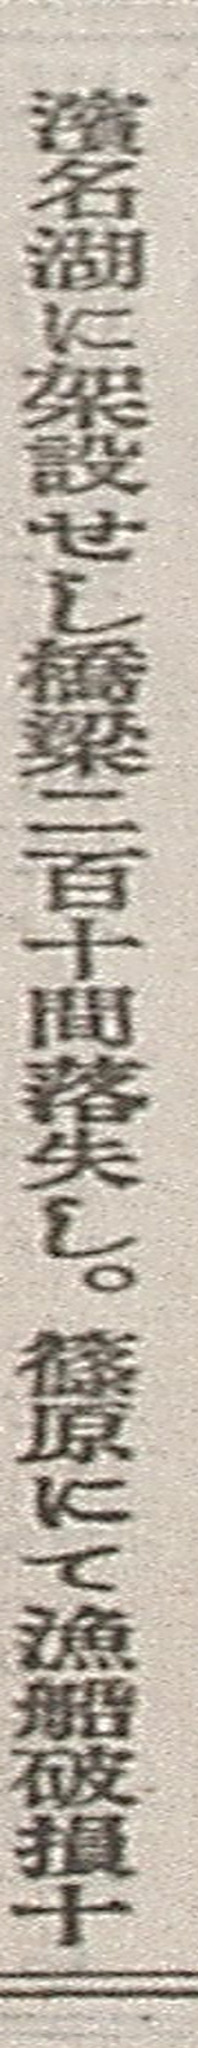浜名湖に架設せし橋梁二百十間落失し。篠原にて漁船破損十
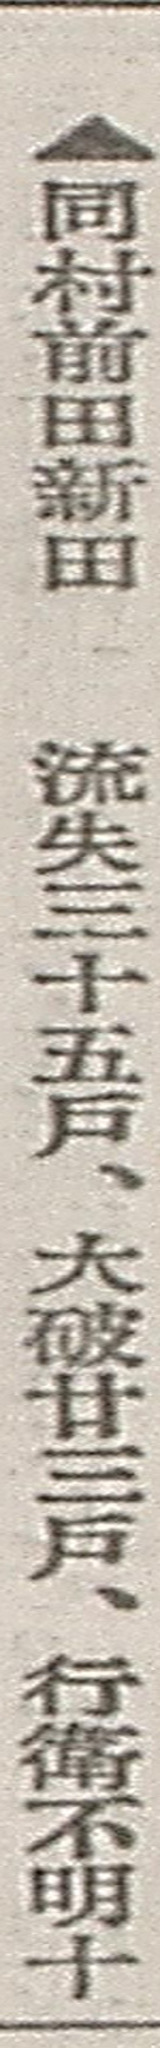▲同村前田新田流失三十五戸、大破廿三戸、行衛不明十
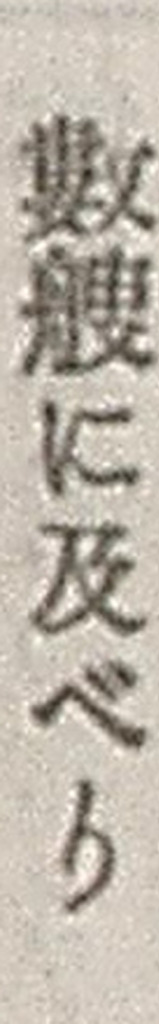数艘に及べり
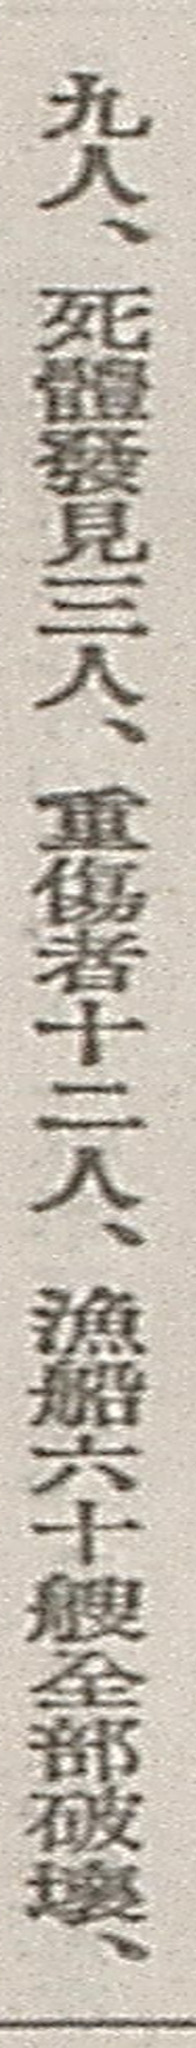九人、死体発見三人、重傷者十二人、漁船六十艘全部破壊、
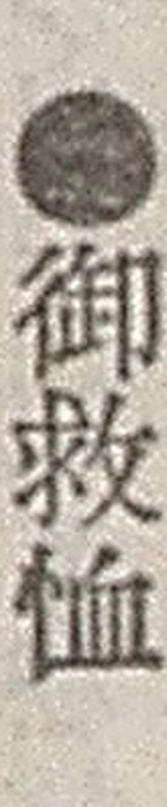●御救恤
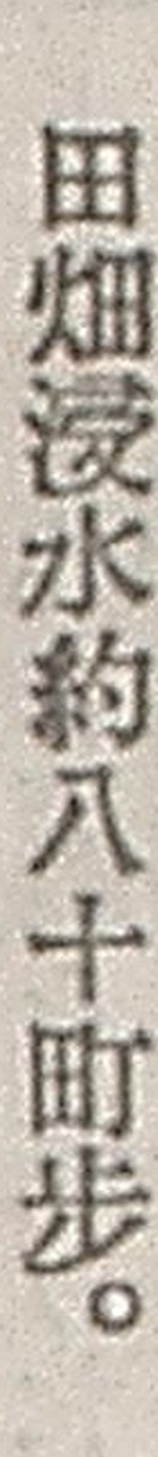田畑浸水約八十町歩。
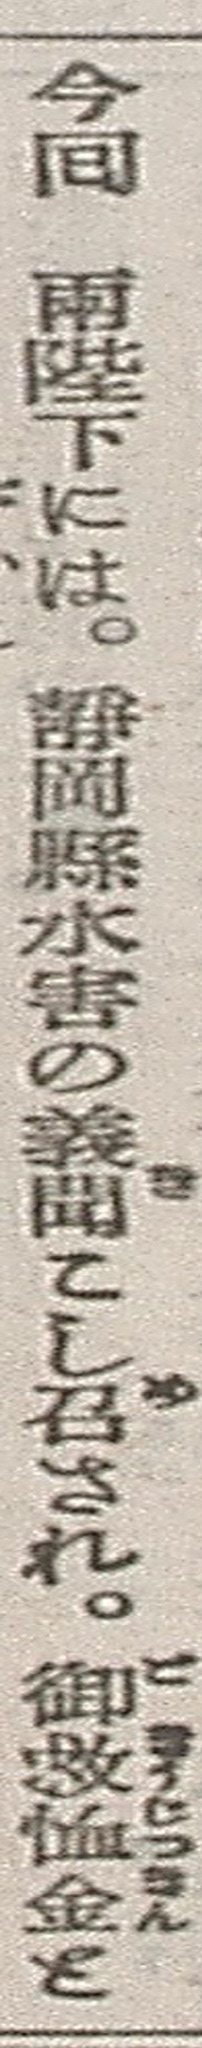今回両陛下には。静岡県水害の義聞こし召され。御救恤金と
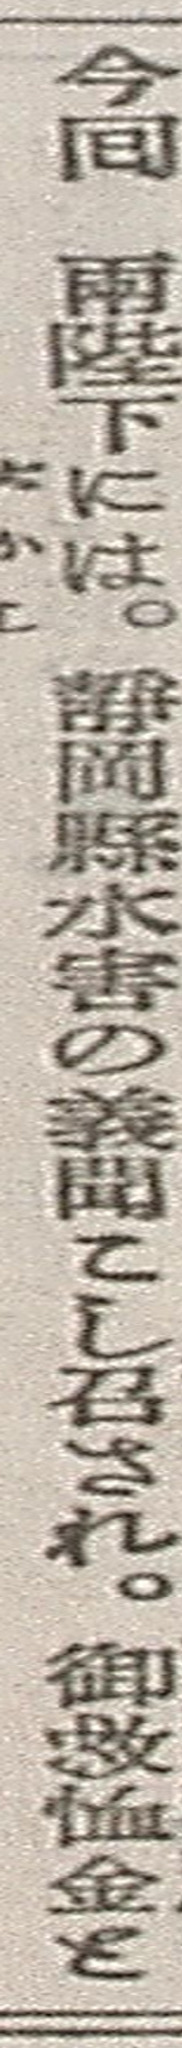今回両陛下には。静岡県水害の義聞こし召され。御救恤金と
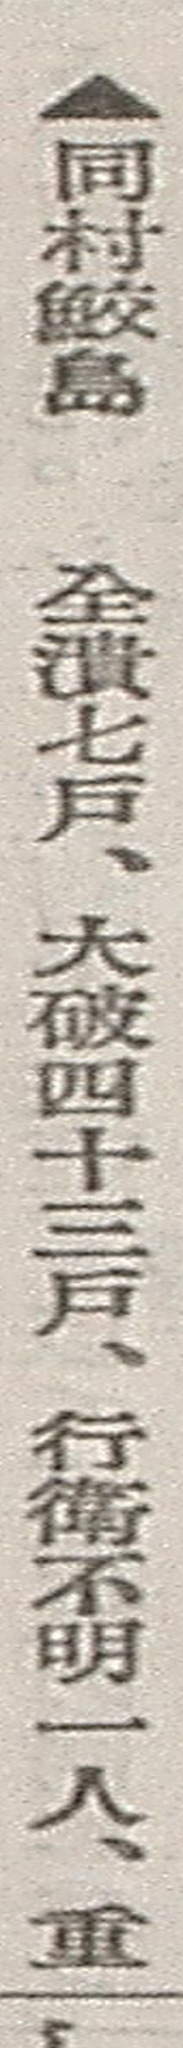▲同村鮫島全潰七戸、大破四十三戸、行衛不明一人、重
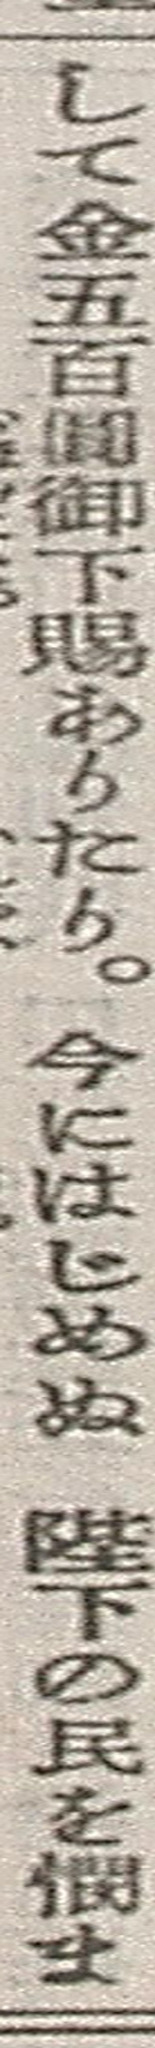して金五百円御下賜ありたり。今にはじめぬ陛下の民を憫ま
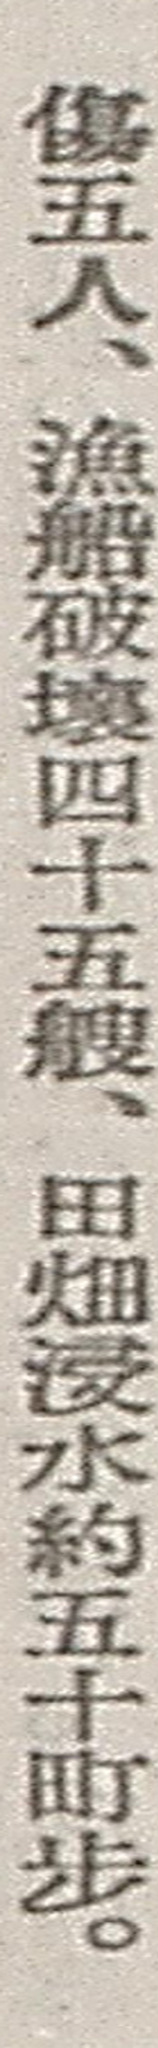傷五人、漁船破壊四十五艘、田畑浸水約五十町歩。
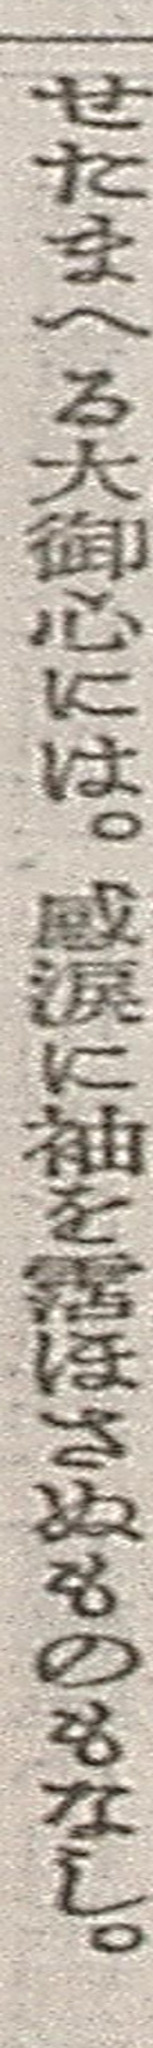せたまへる大御心には。感涙に袖を霑ほさぬものなし。
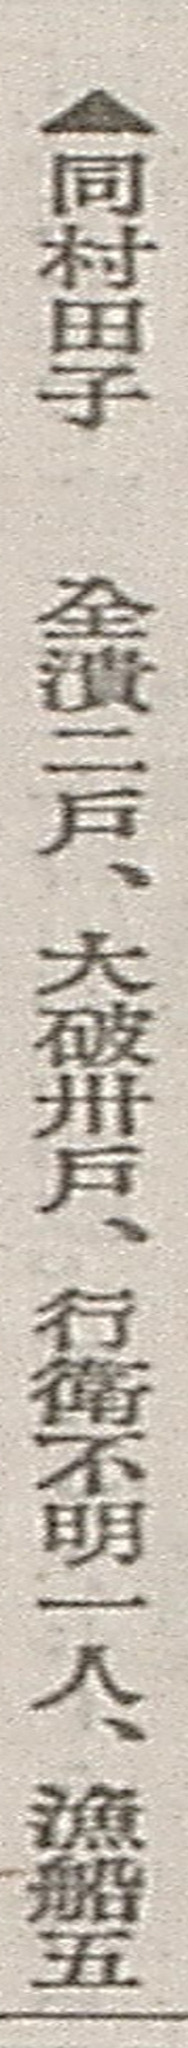▲同村田子全潰二戸、大破卅戸、行衛不明一人、漁船五
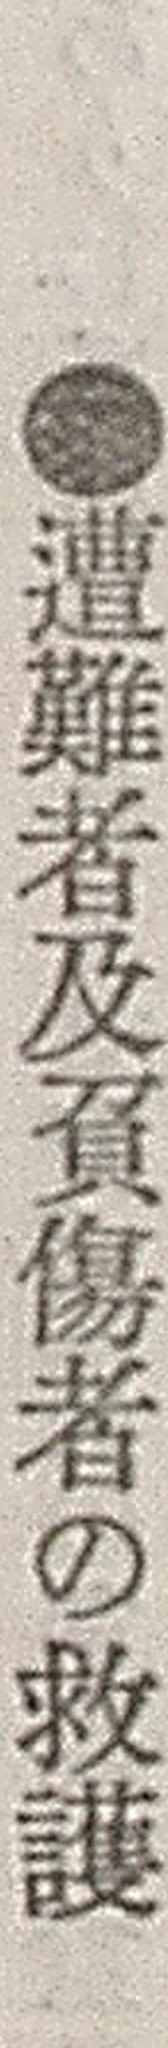●遭難者及負傷者の救護
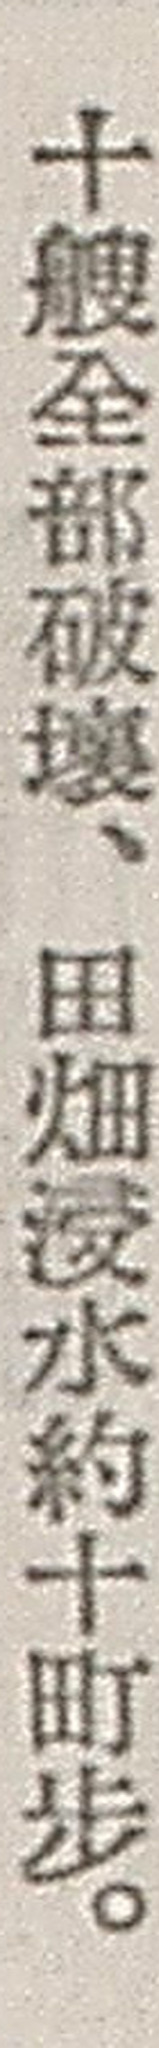十艘全部破壊、田畑浸水約十町歩。
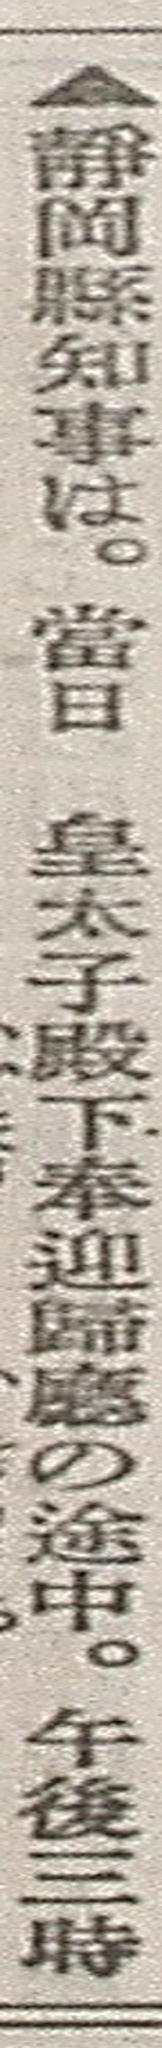▲静岡県知事は。当日皇太子殿下奉迎帰応の途中。午後三時
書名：風俗畫報臨時増刊第百九十九號　明治三十二年十月各地災害圖會（前編之續）
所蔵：東京大学地震研究所図書室 Earthquake Research Institute Library, The University of Tokyo, JAPAN
